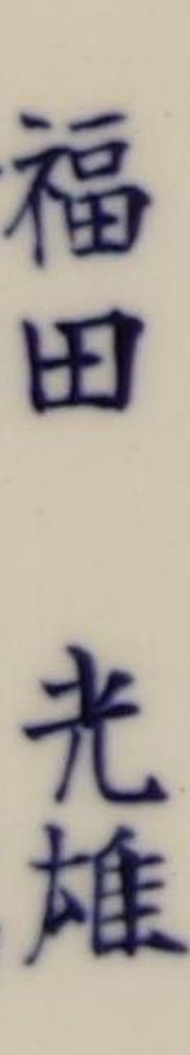福田光雄
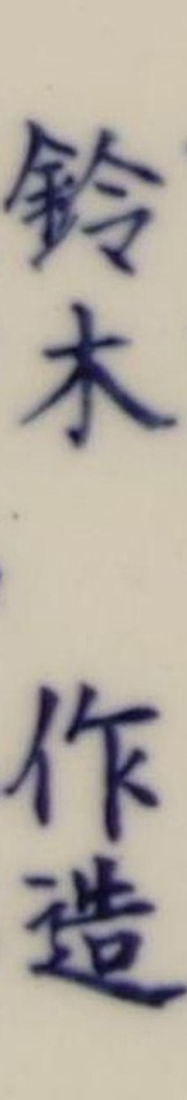鈴木作造
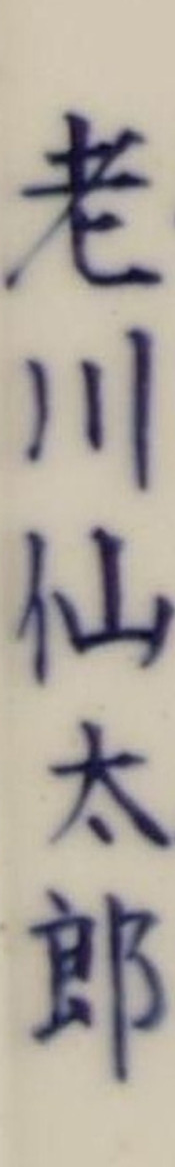老川仙太郎

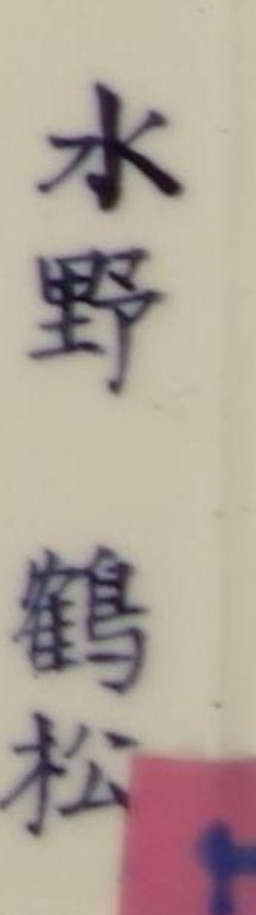水野鶴松
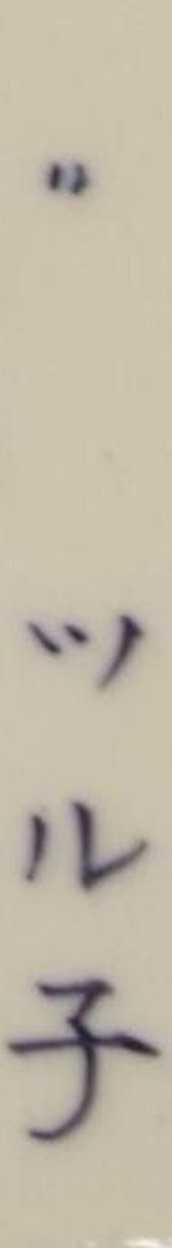ツル子
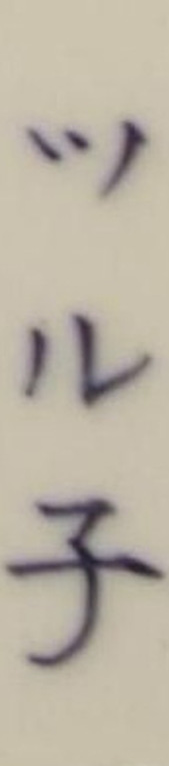ツル子
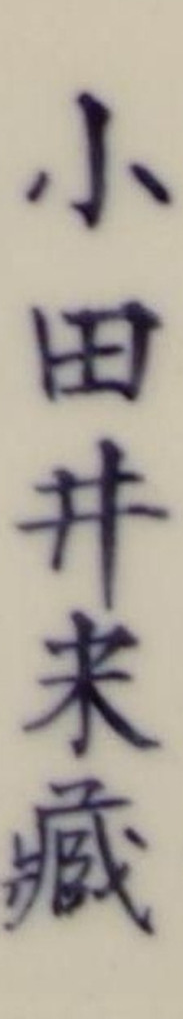小田井米蔵
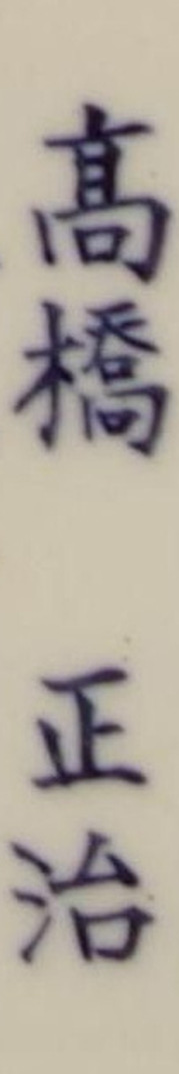高橋正治
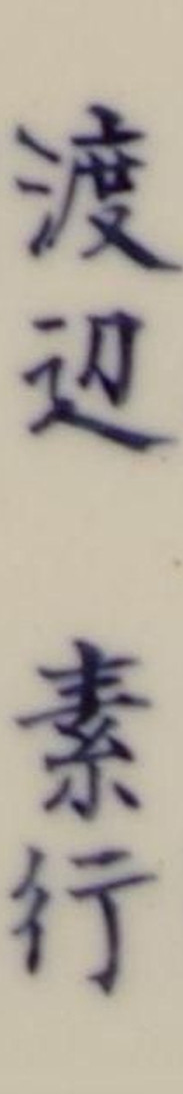渡辺素行
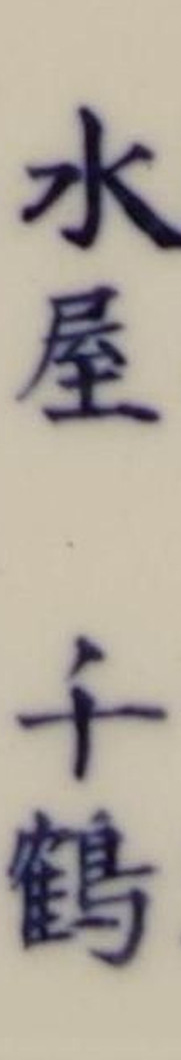水屋千鶴
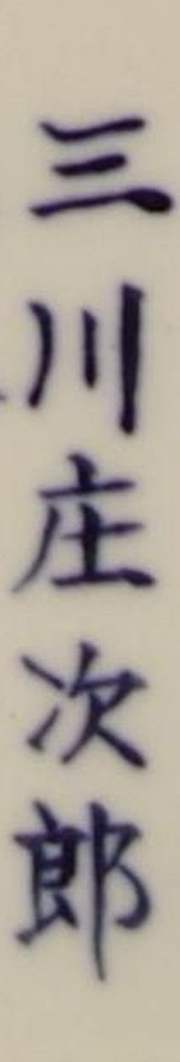三川庄次郎
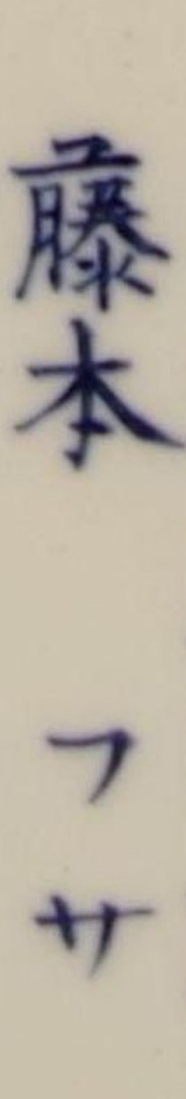藤本フサ
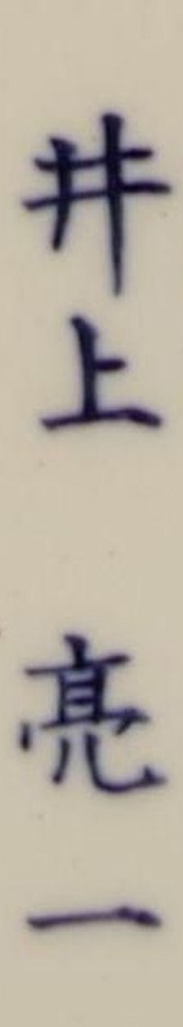井上亮一
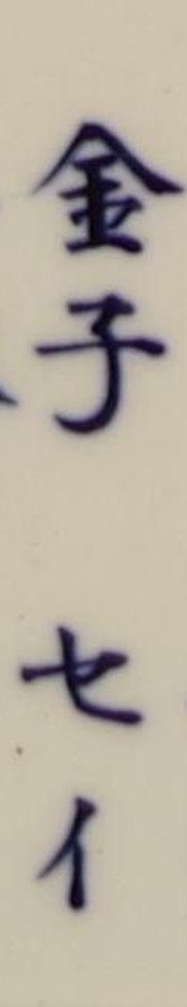金子セイ
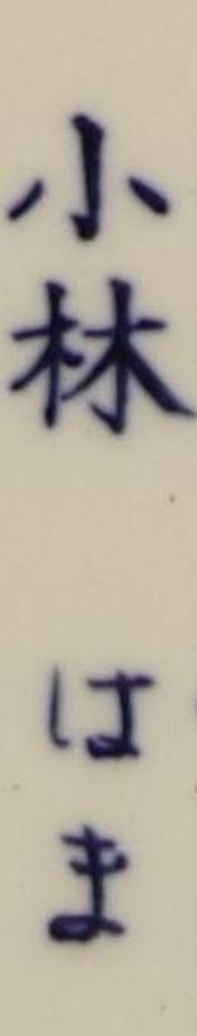小林はま
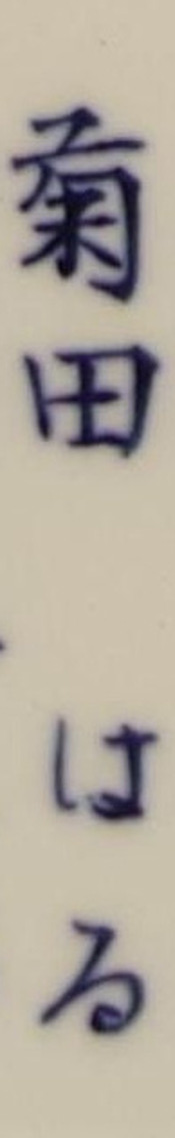菊田はる
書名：E~L
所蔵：高野山金剛峯寺
